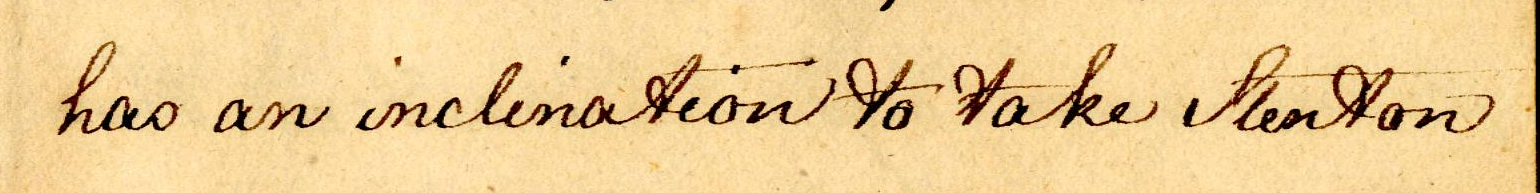has an inclination to take Stenton
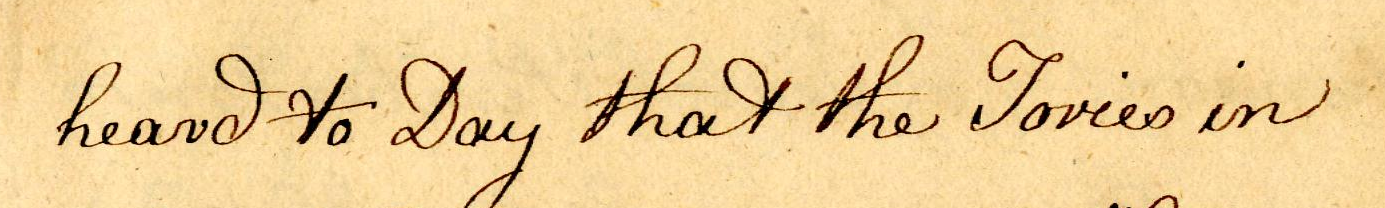heard to Day that the Tories in
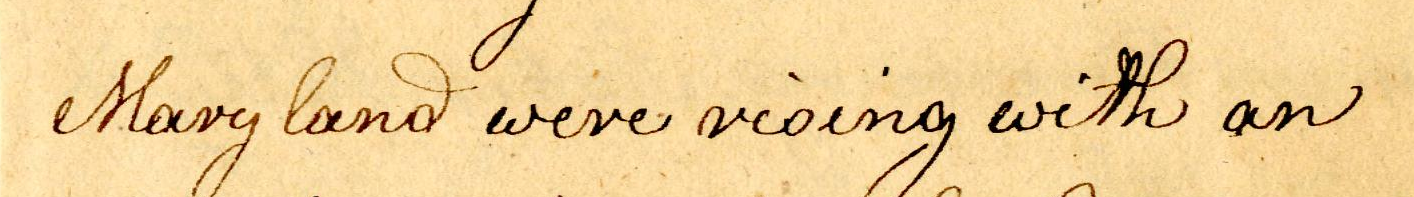Maryland were vising with an
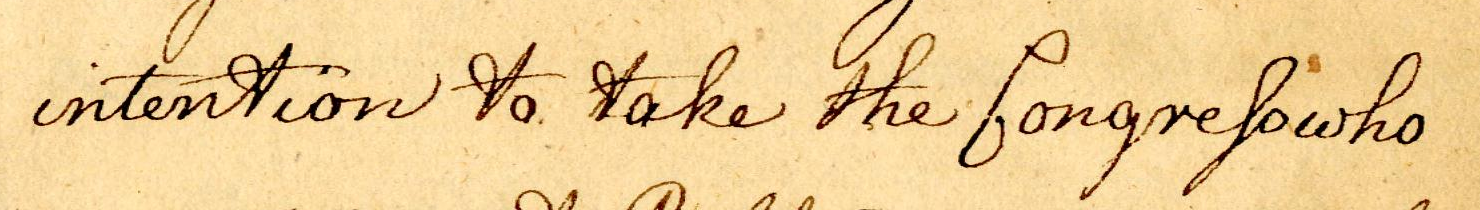intention to take the Congress who
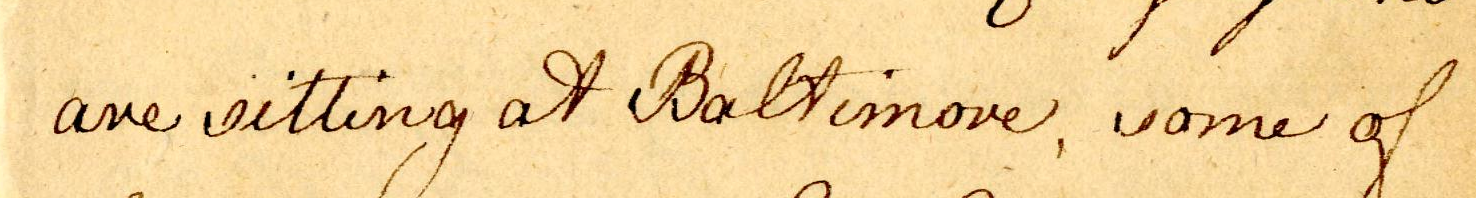are sitting at Baltimore, some of
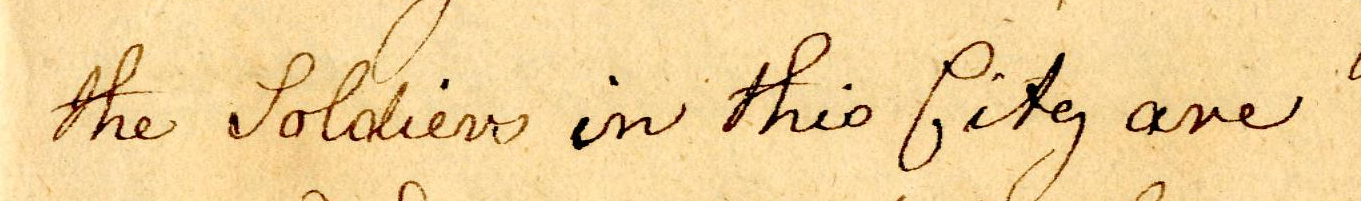the Soldiers in this City are
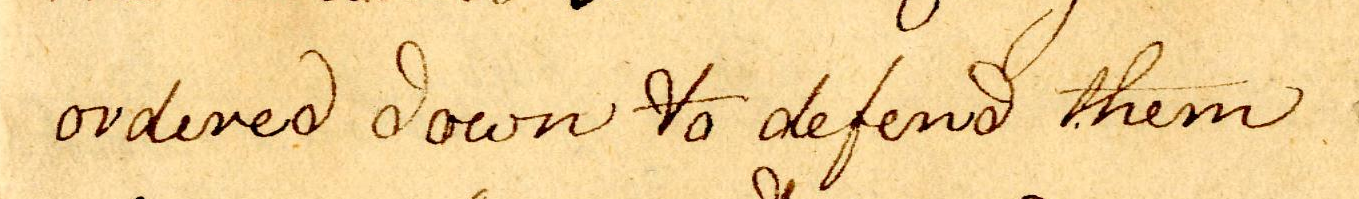ordered down to defend them
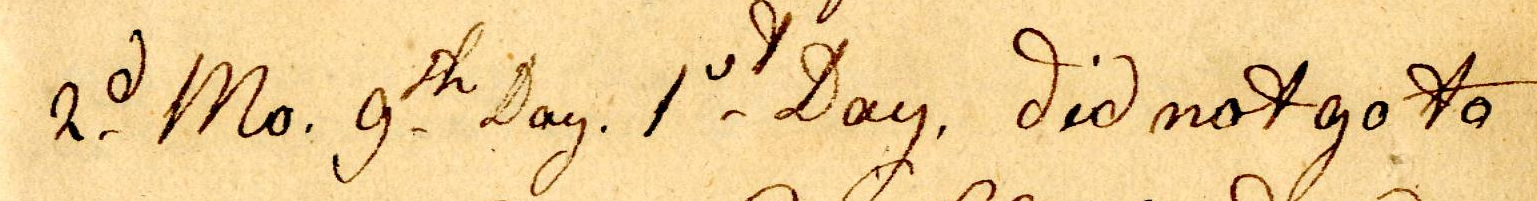2^d Mo 9^th Day. 1^st Day. did not go to
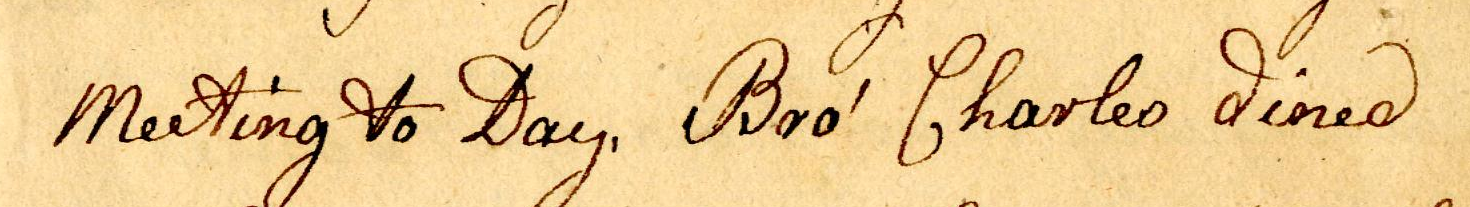Meeting to Day. Bro' Charles dined
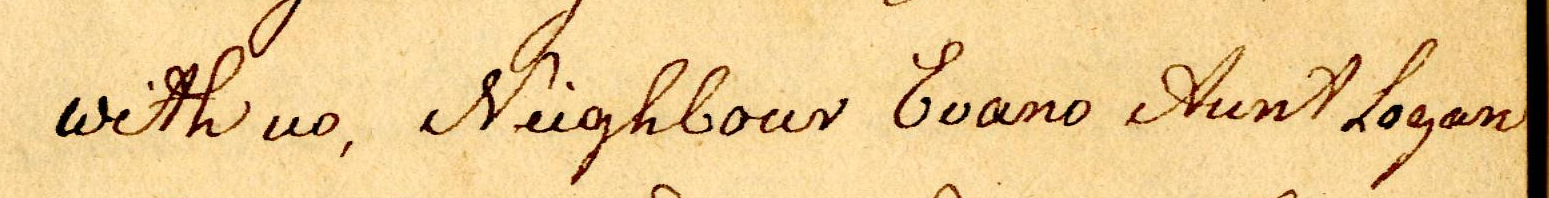with us, Neighbour Evans Aunt Logan
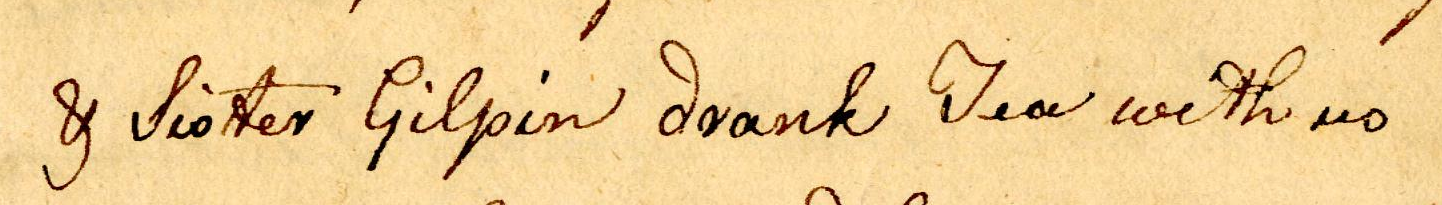& Sister Gilpin drank Tea with us
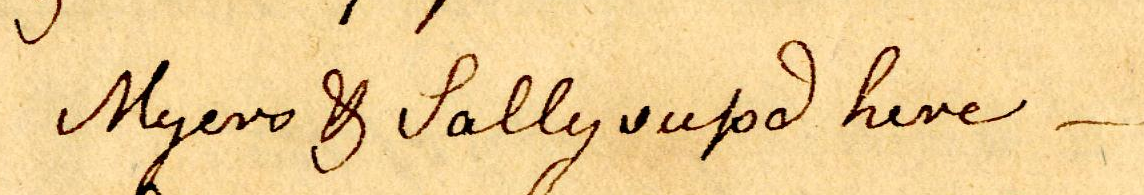Myers & Sally supd here-
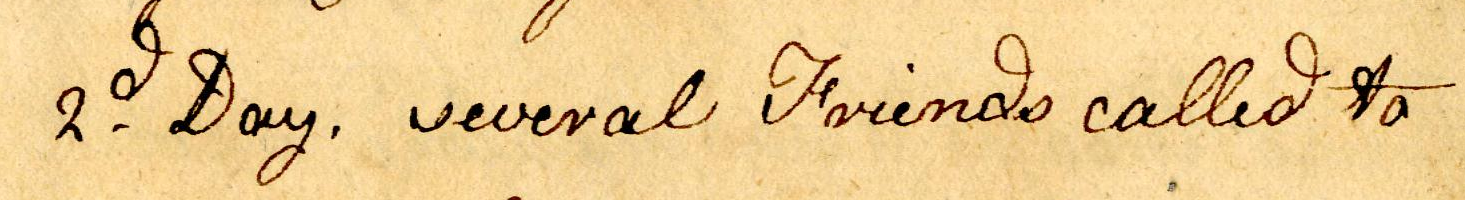2^d Day. several Friends called to
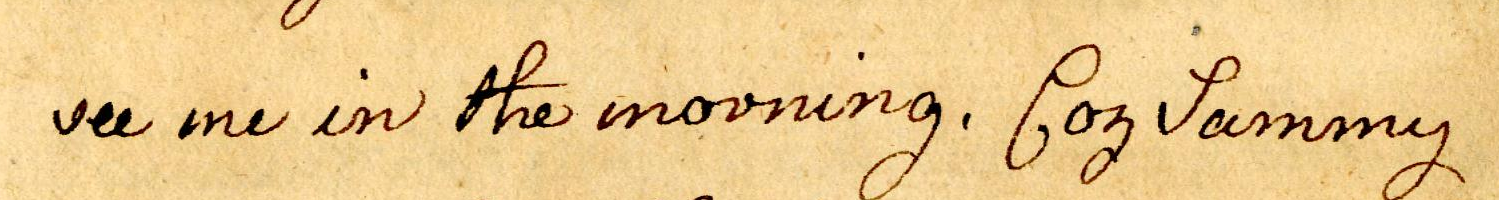see me in the morning, Coz Sammy
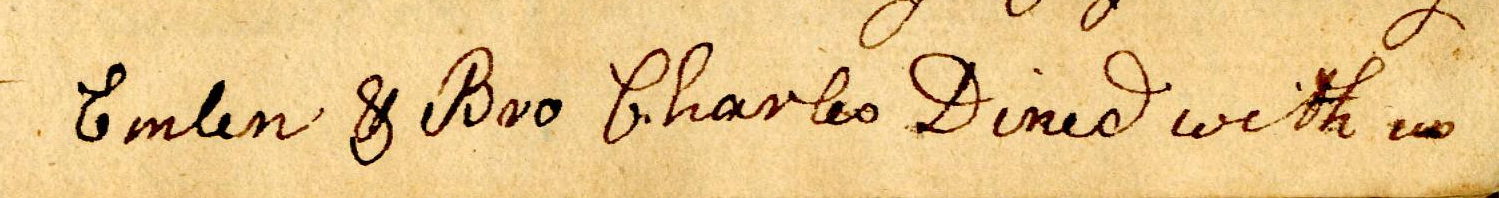Emlen & Bro Charles Dined with us
